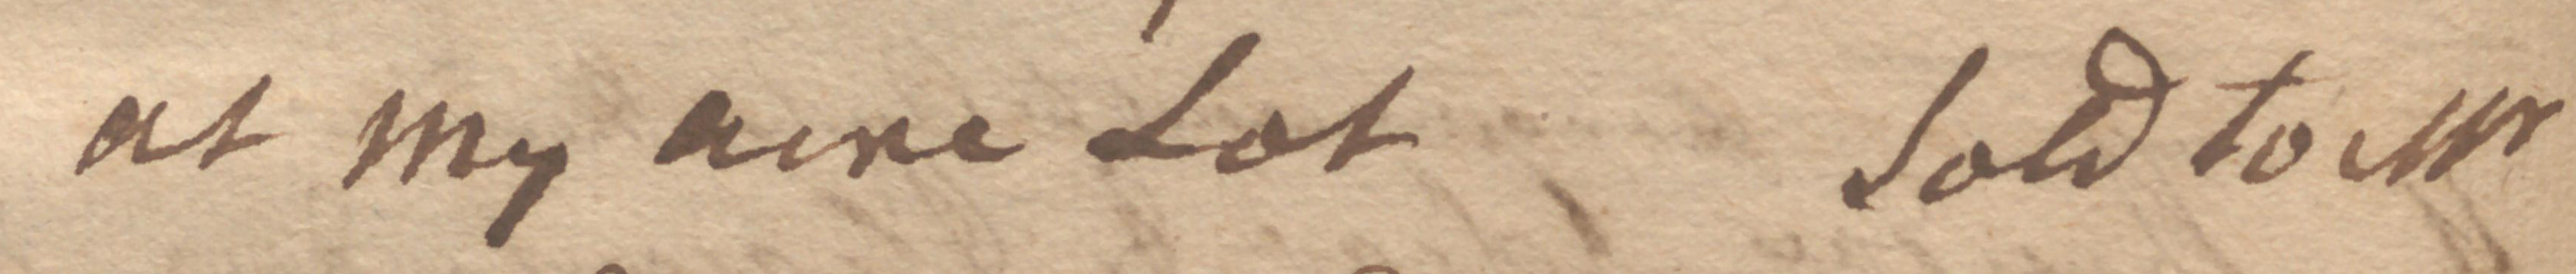at my acre Lot sold to M^r
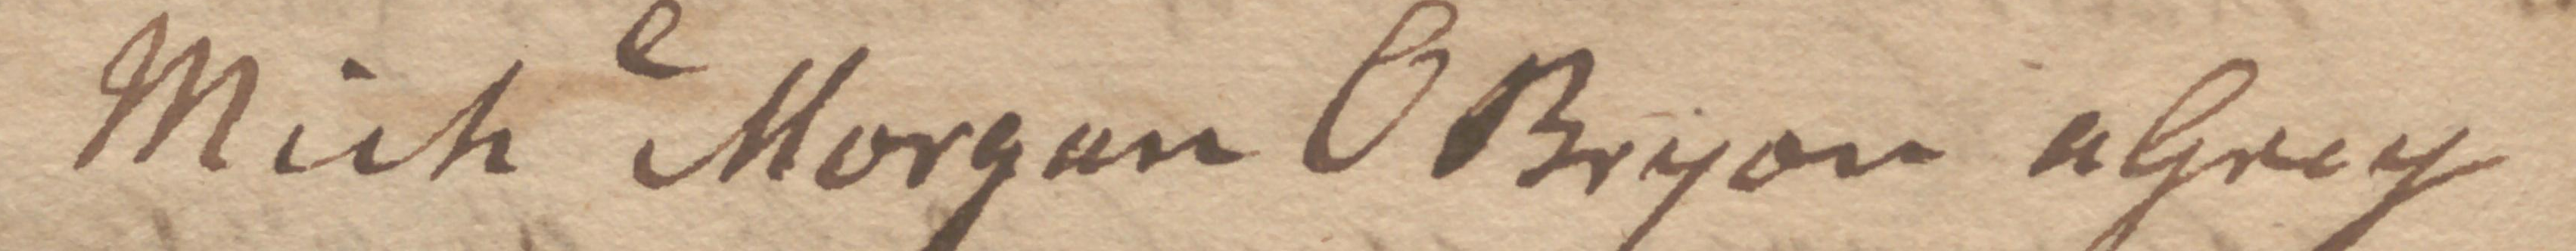Mich^l Morgan & Bryon a Grey
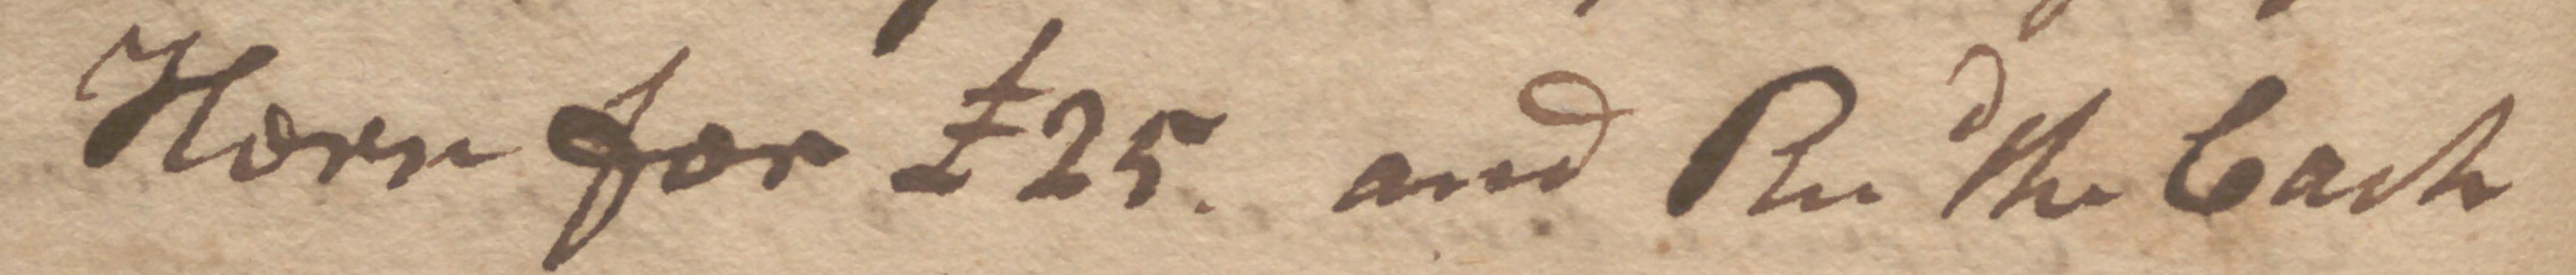Horse for £25. and Rec^d The Cach
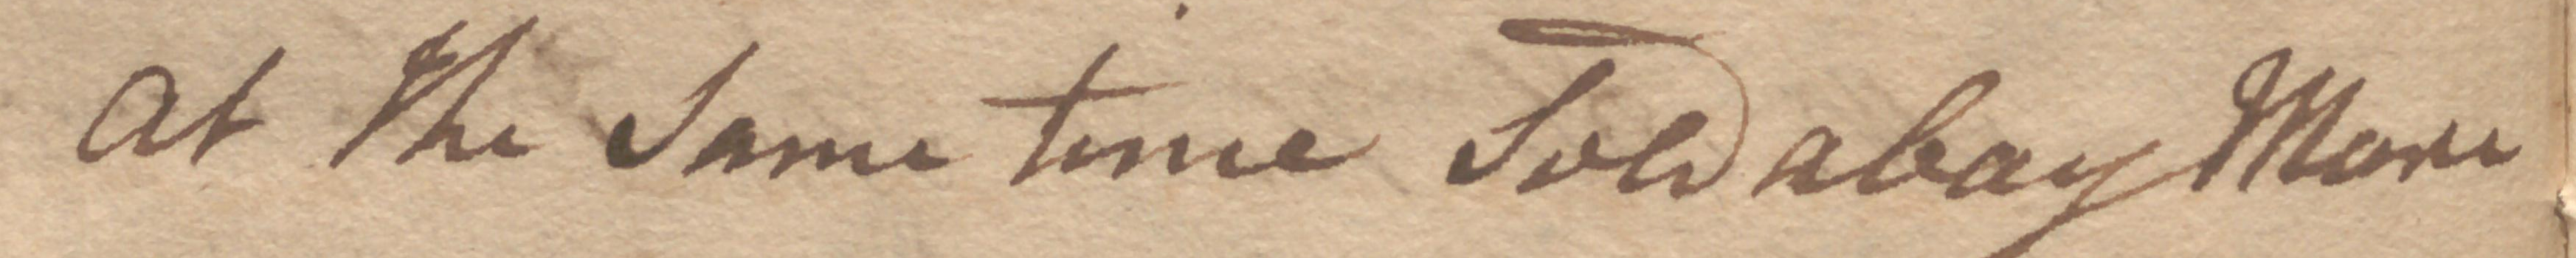At the Same time sold a bay Mare
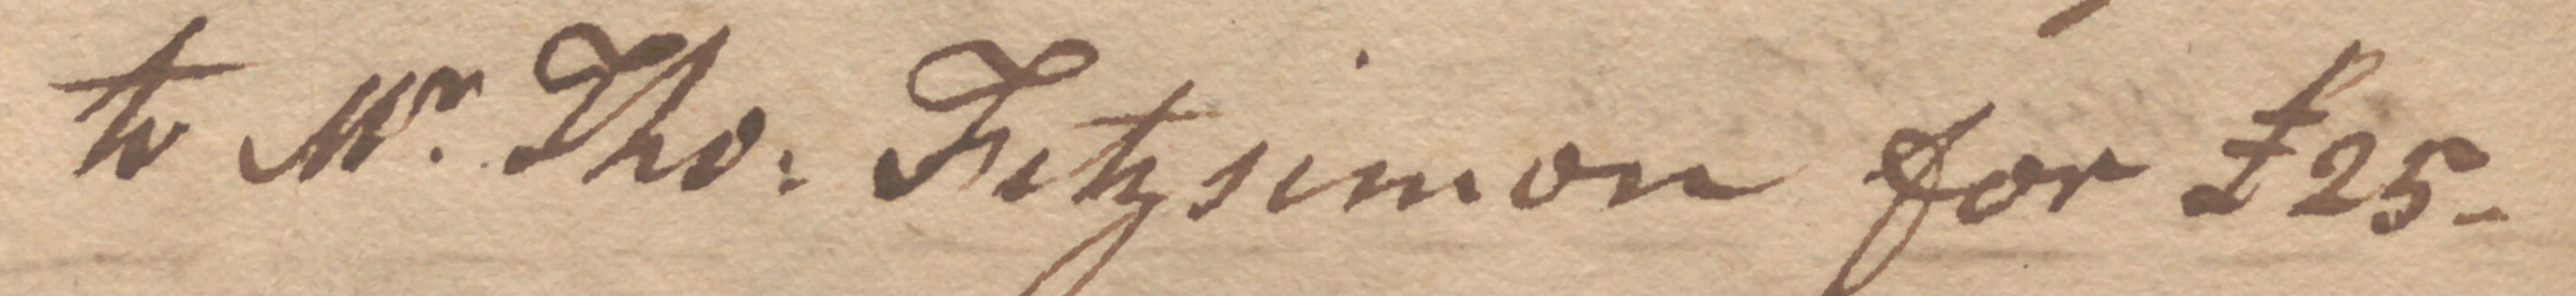to M^r. Thos. Fitzsimon for £25-
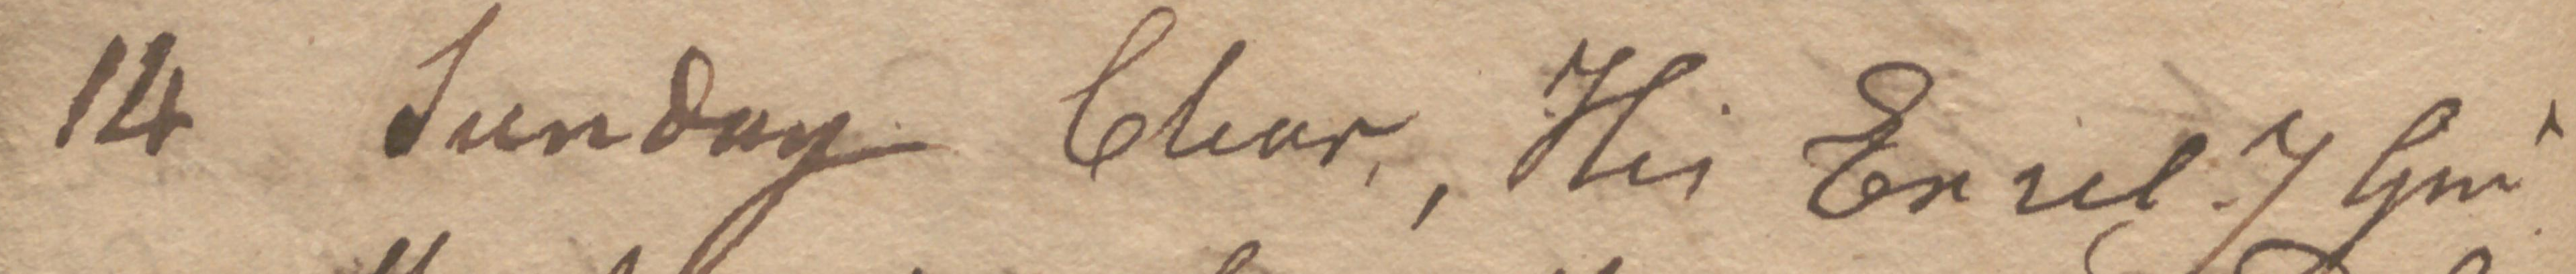14 Sunday Clear, His Excel^y Gen^l.
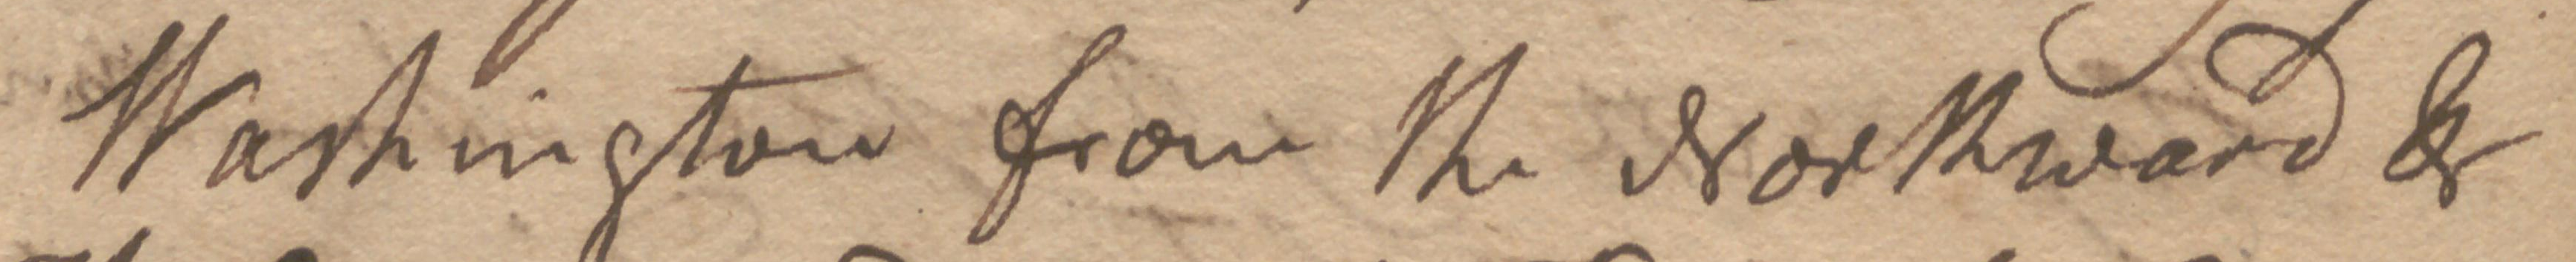Washington from the Northward &
